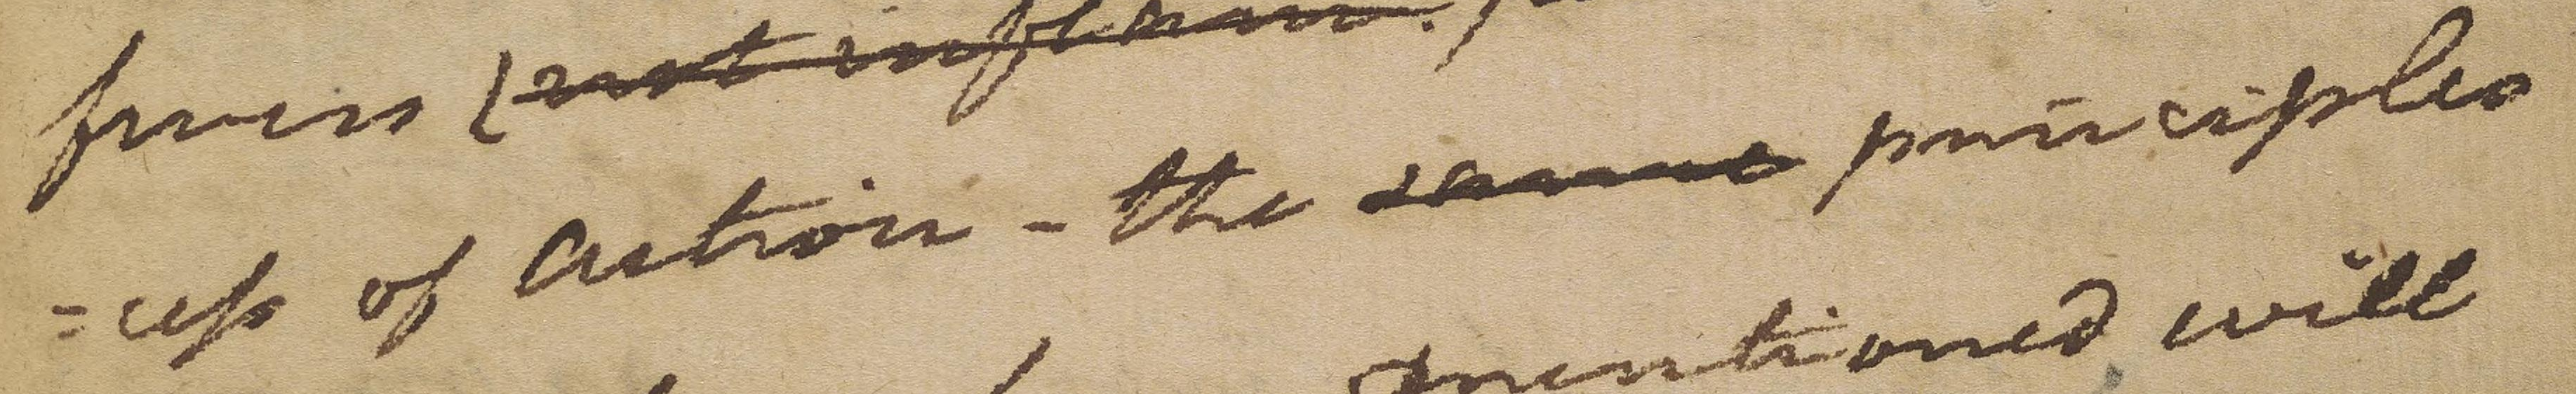-cess of Action, the [same] principles
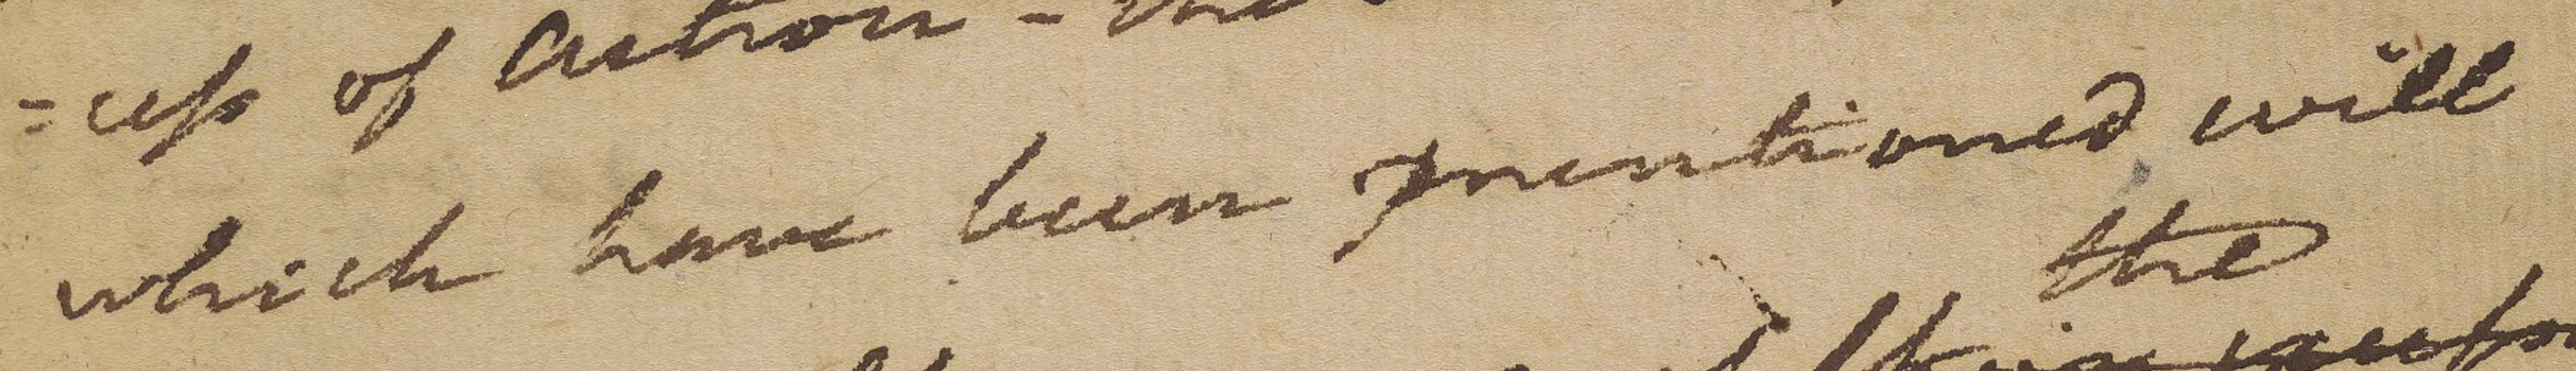which have been positioned will
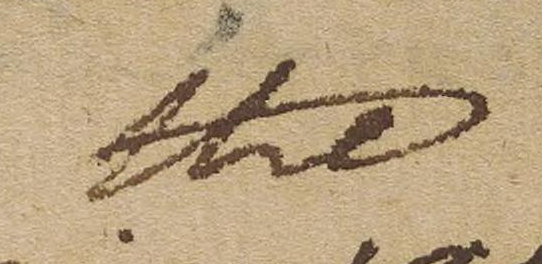the
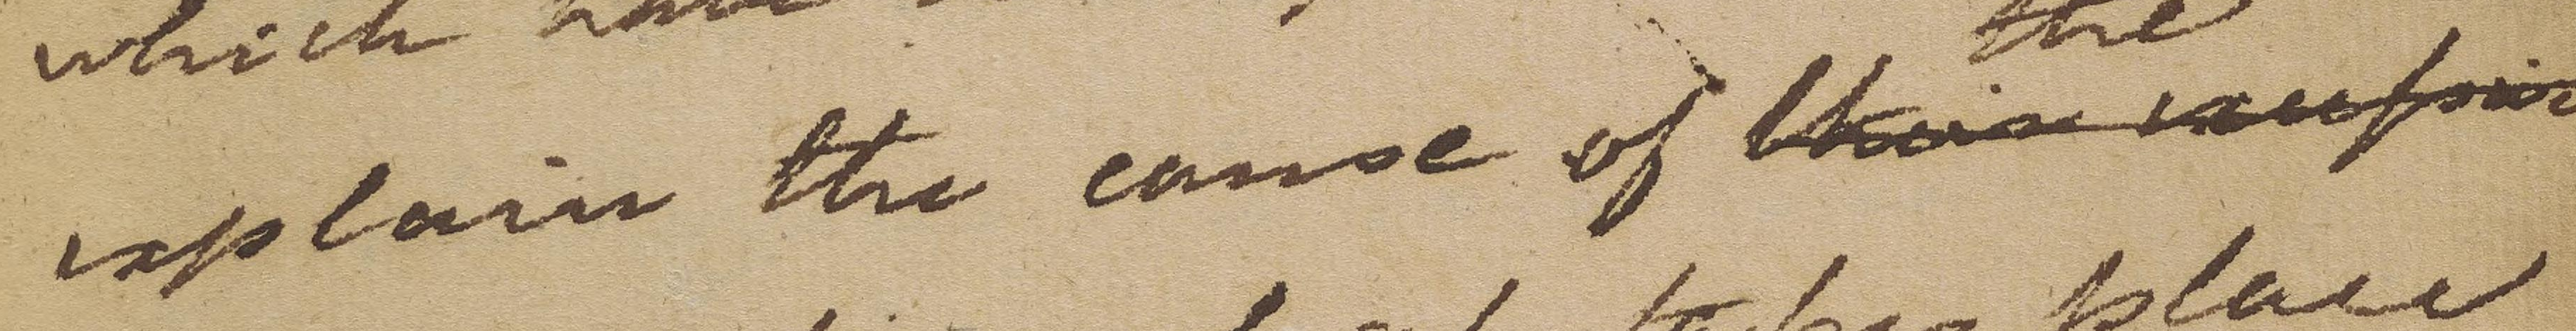explain the cause of [their excessive]
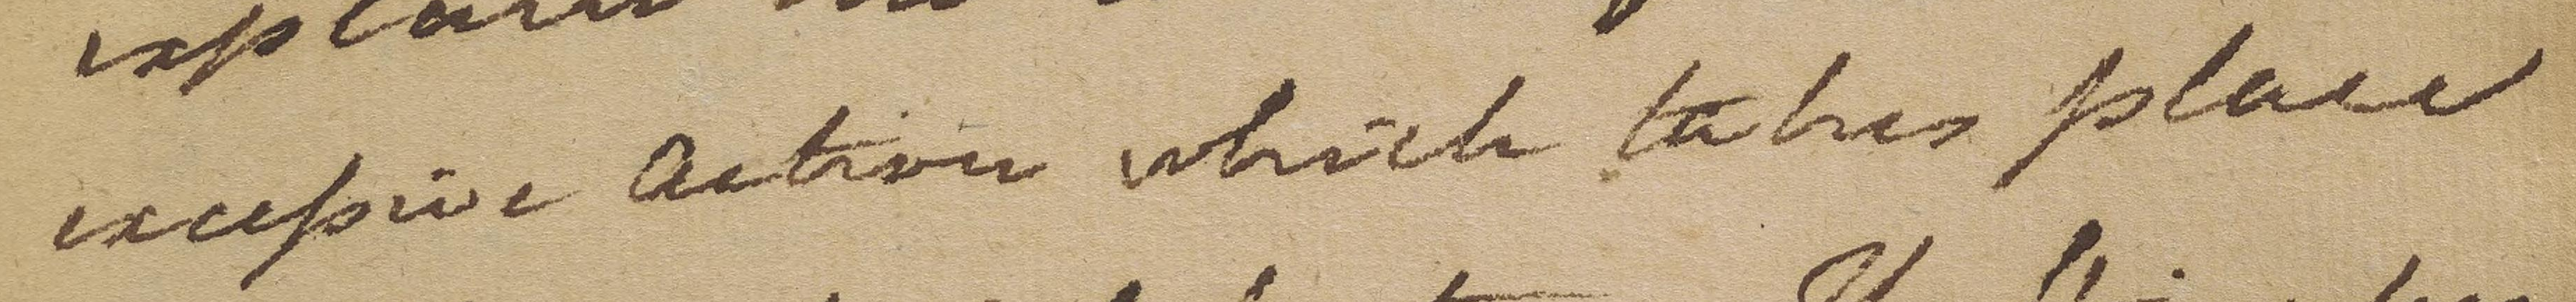excessive action which takes place
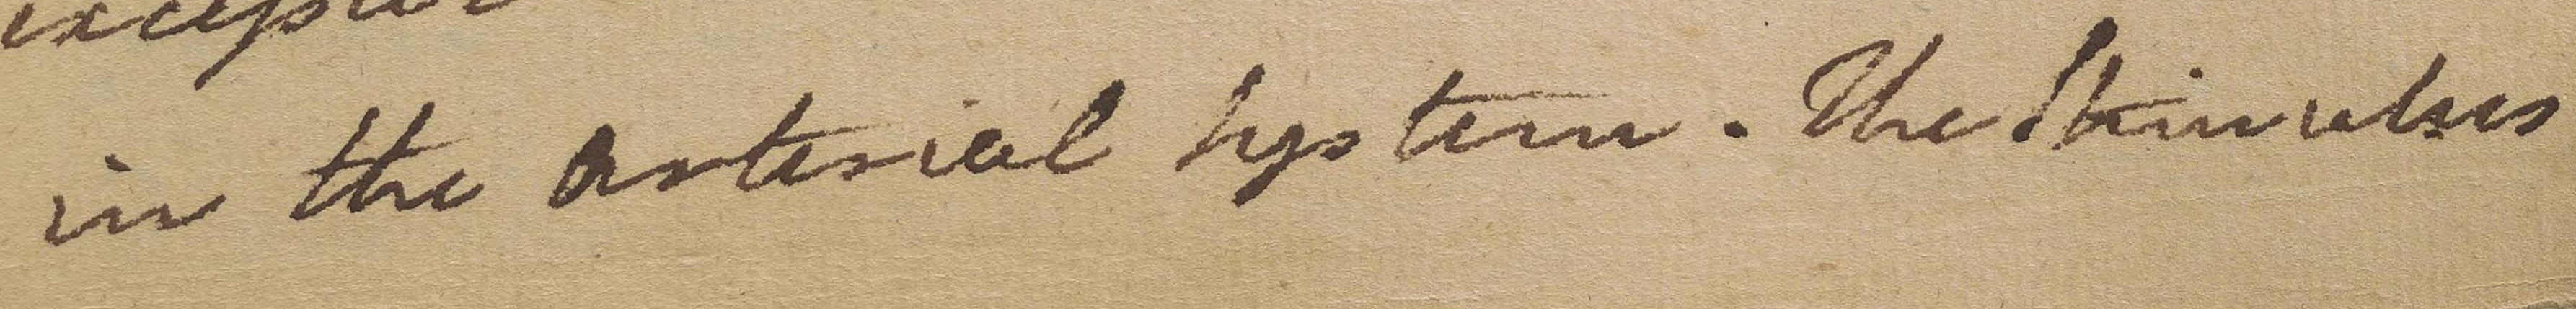in the arterial system. The stimulus
